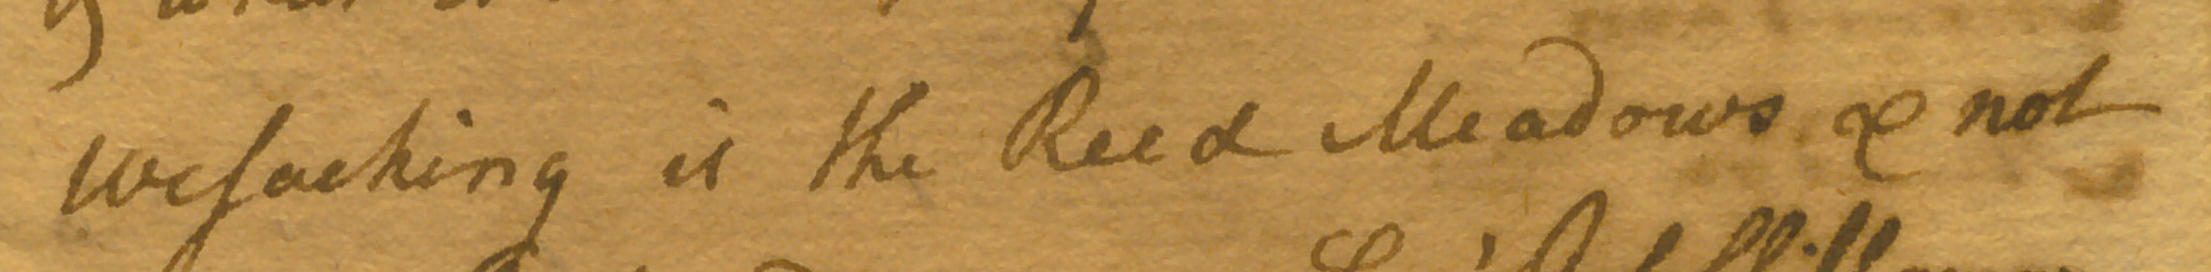Wesacking is the Reed Meadows & not
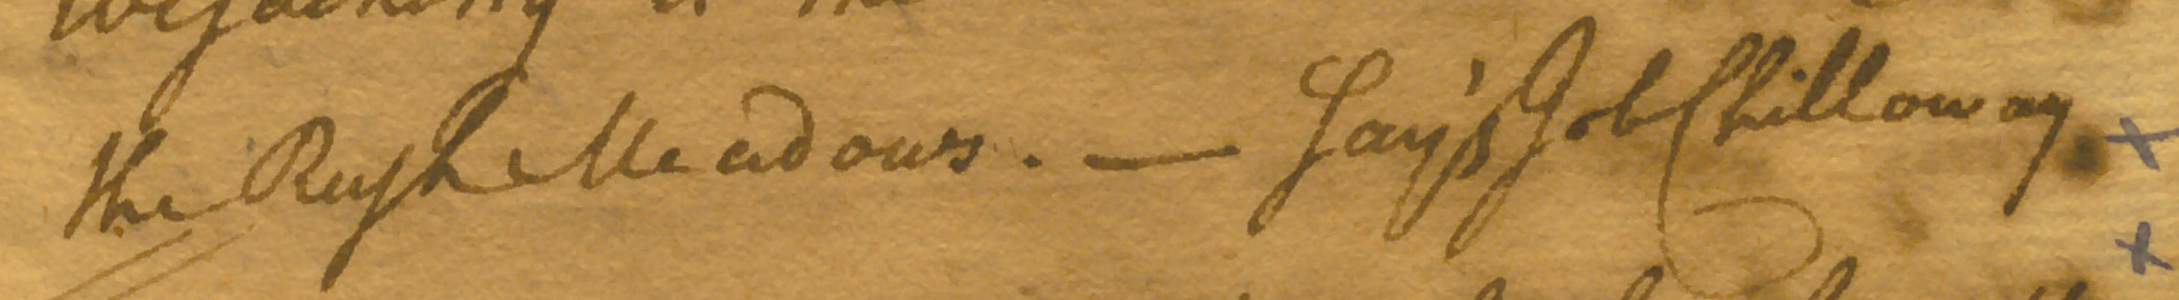the Rush Meadows.- Say's Job Chilloway
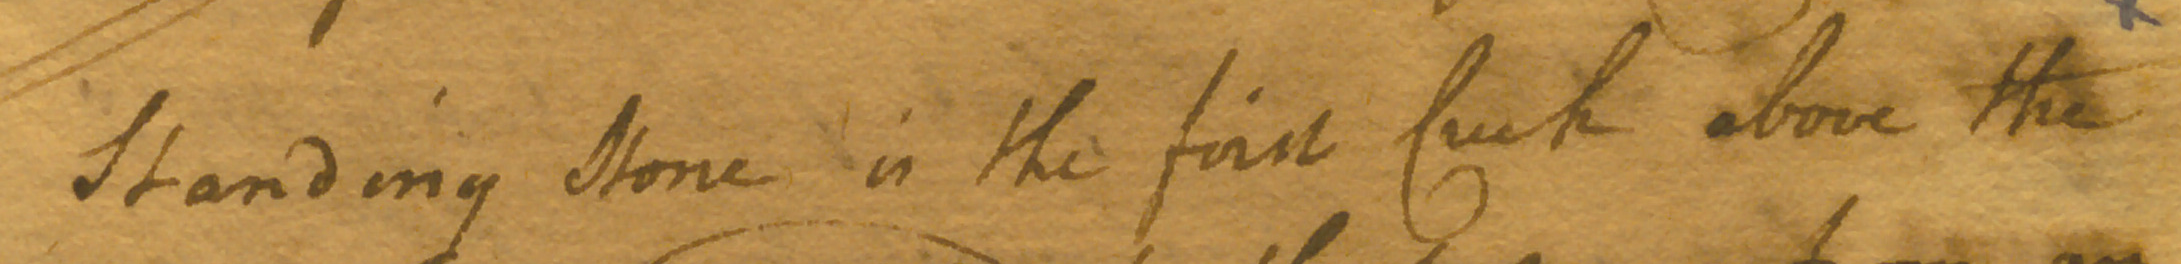Standing Stone in the first Creek above the
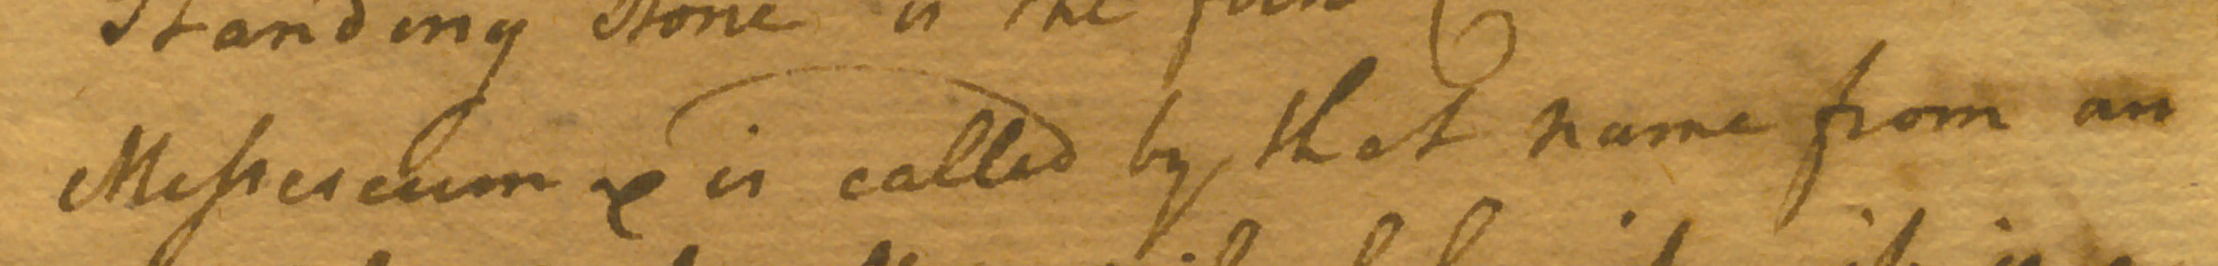Messescum & is called that name from an
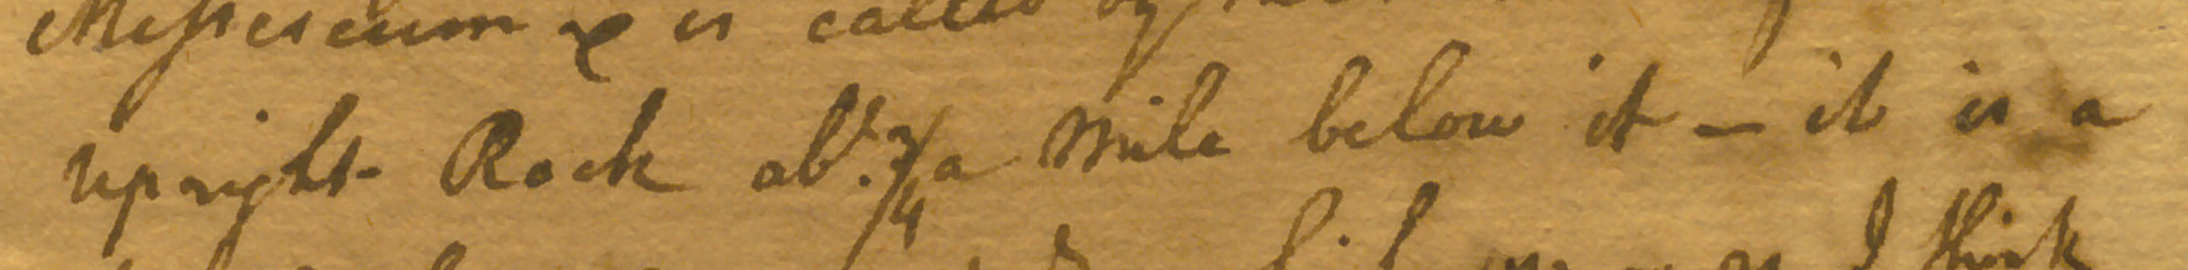upright Rock ab^t. 3/4 a mile below it- it is a
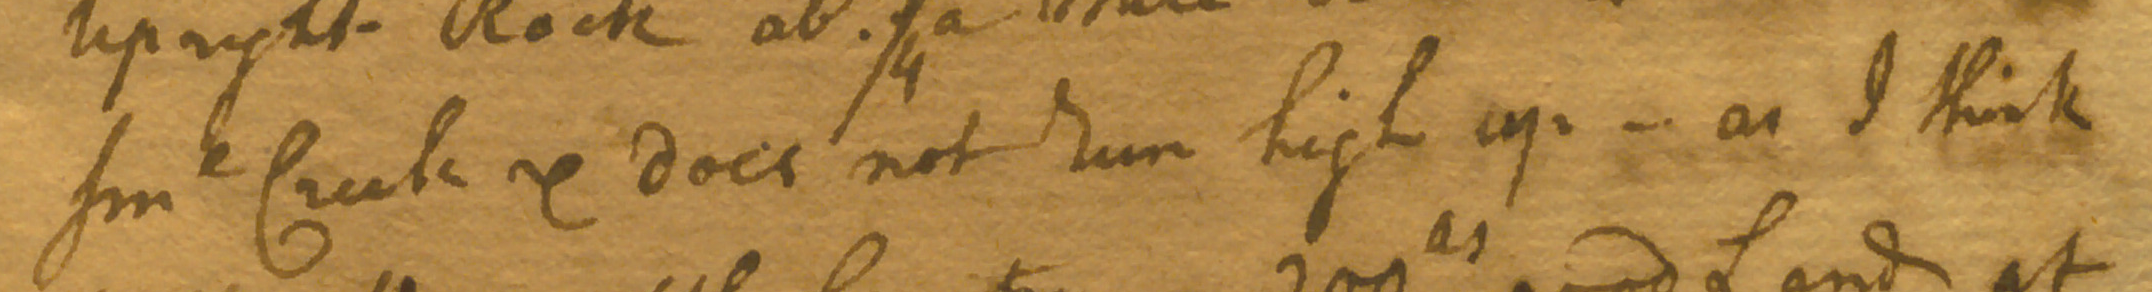sm^l Creek & does not run high up- as I think
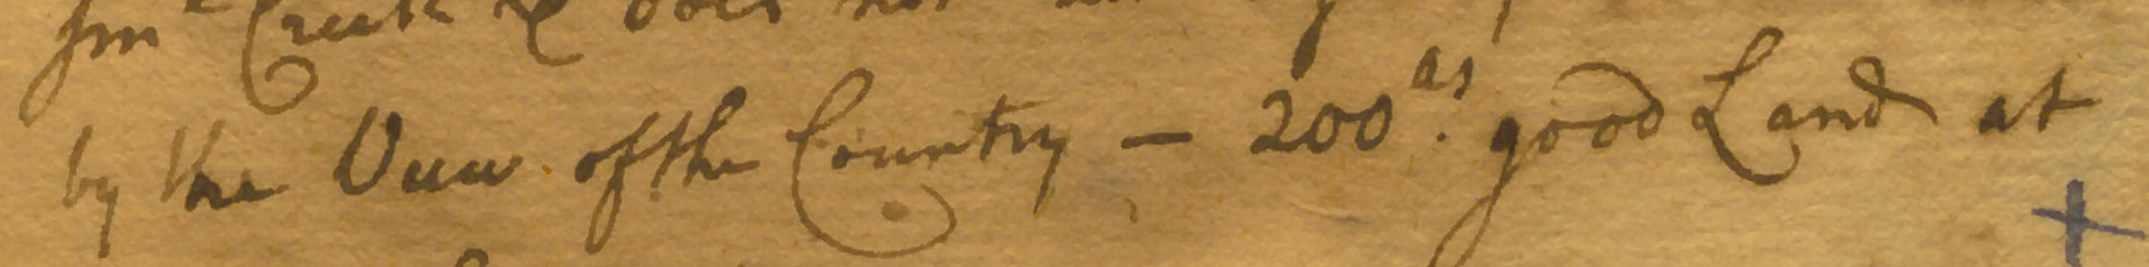by the View of the country- 200 ^as. good Land at
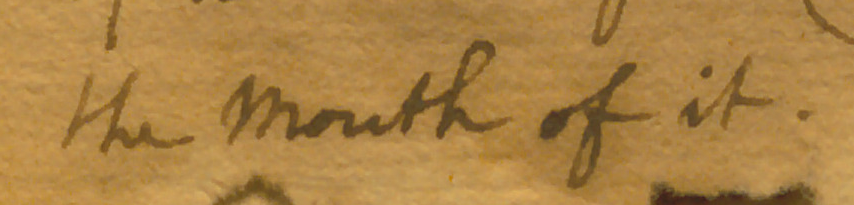the mouth of it.
